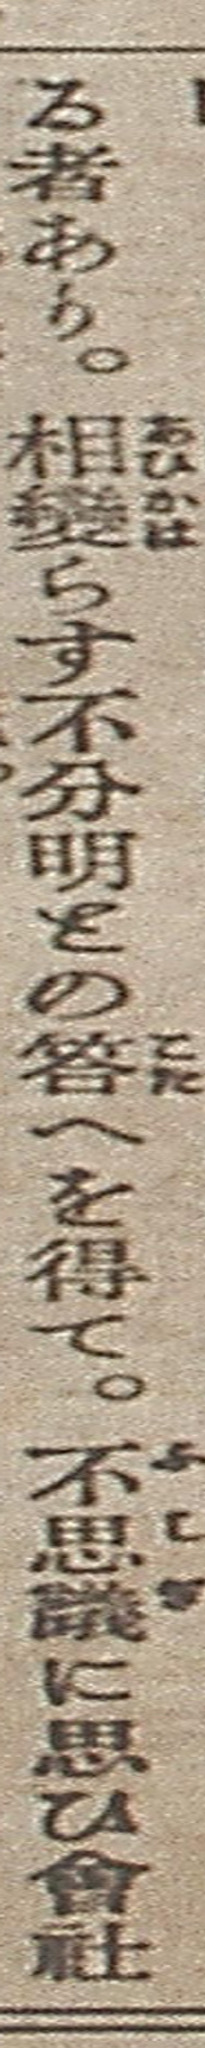る者あり。相変らす不分明との答へを得て。不思議に思ひ会社
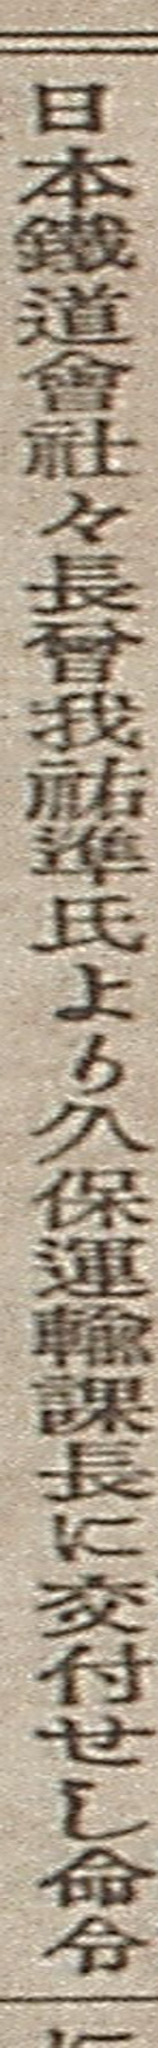日本鉄道会社々長曽我祐準氏より久保運輸課長に交付せし命令
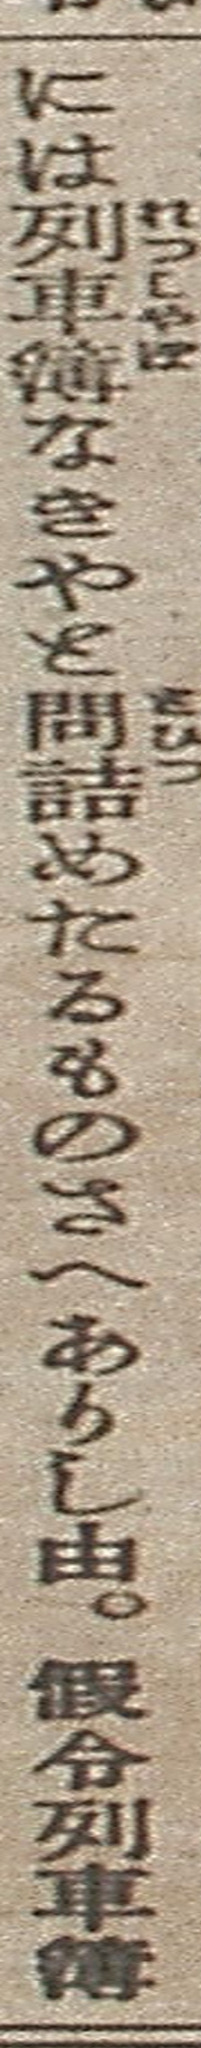には列車簿なきやと問詰めたるものさへありし由。仮令列車簿
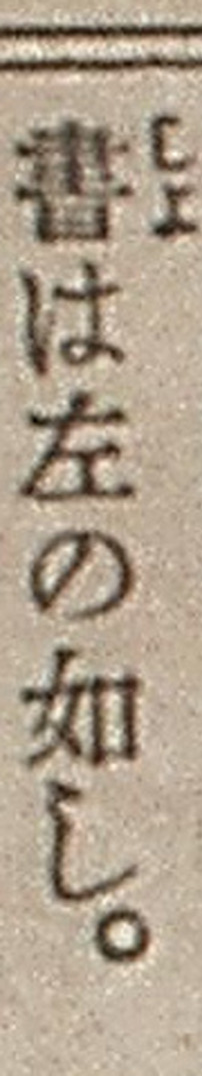書は左の如し。
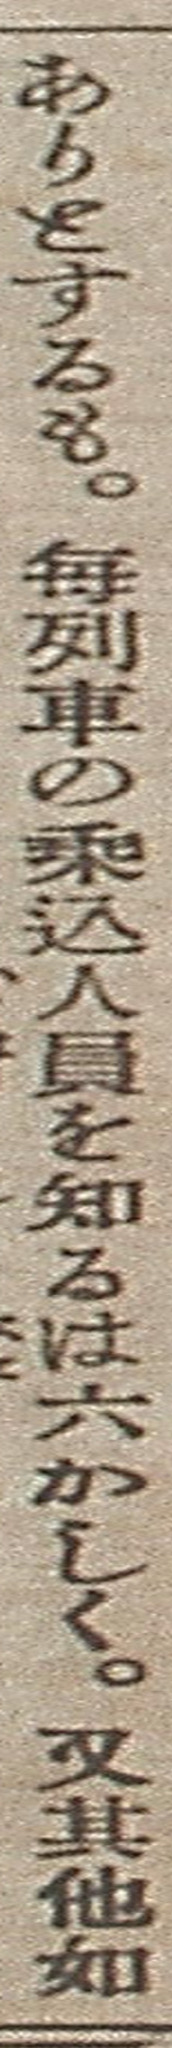ありとするも。毎列車の乗込人員を知るは六かしく。又其他如
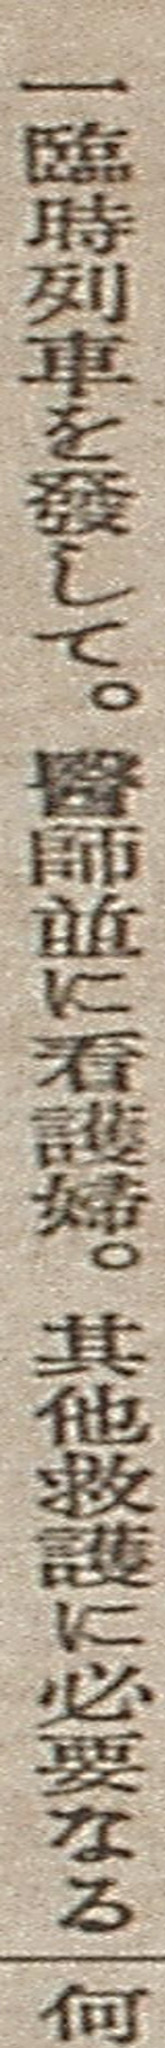一臨時列車を発して。医師並に看護婦。其他救護に必要なる
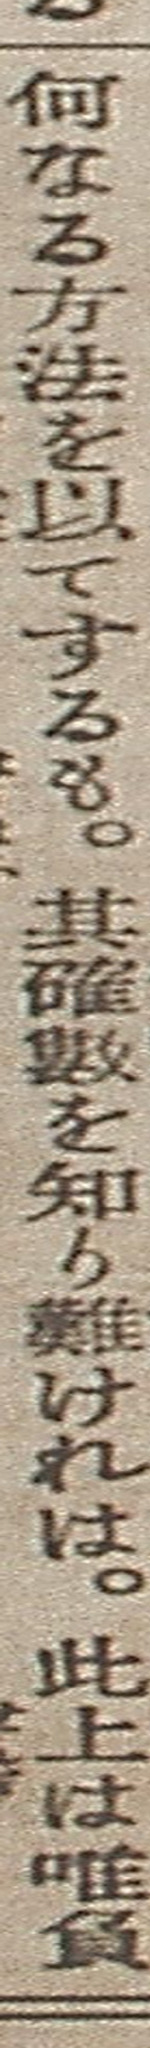何なる方法を以てするも。其確数を知り難けれは。此上は唯負
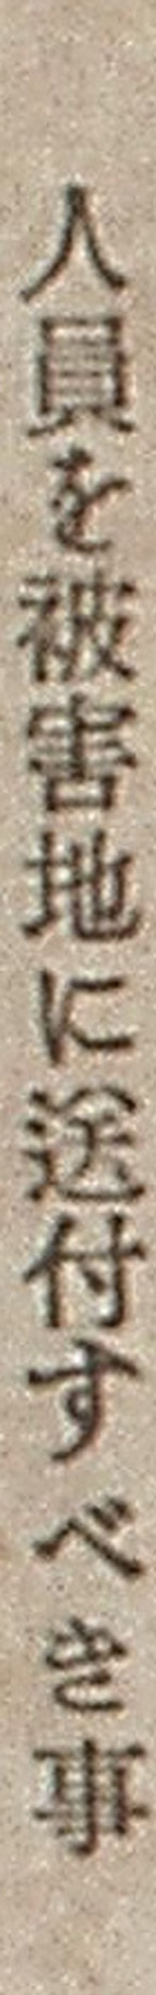人員を被害地に送付すべき事
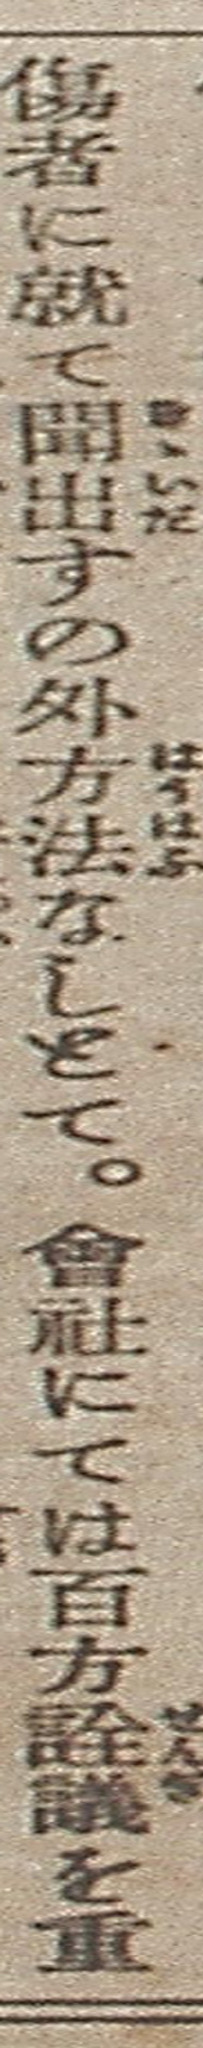傷者に就て聞出すの外方法なしとて。会社にては百方詮議を重
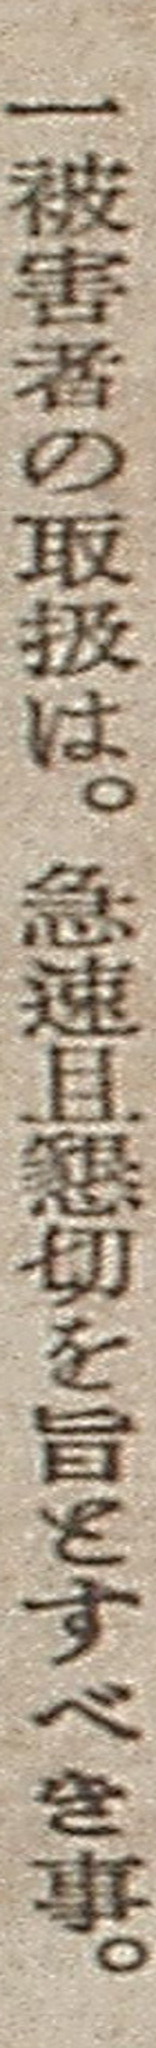一被害者の取扱は。急速且懇切を旨とすべき事。
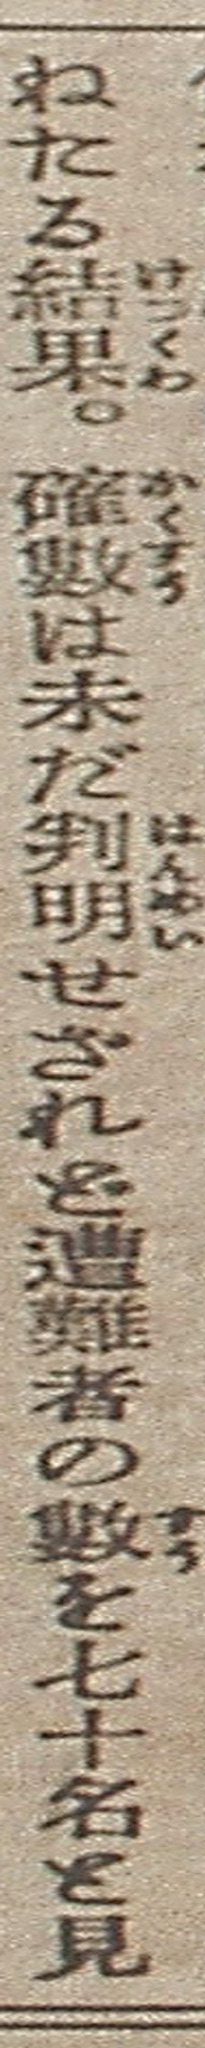ねたる結果。確数は未だ判明せざれど遭難者の数を七十名と見
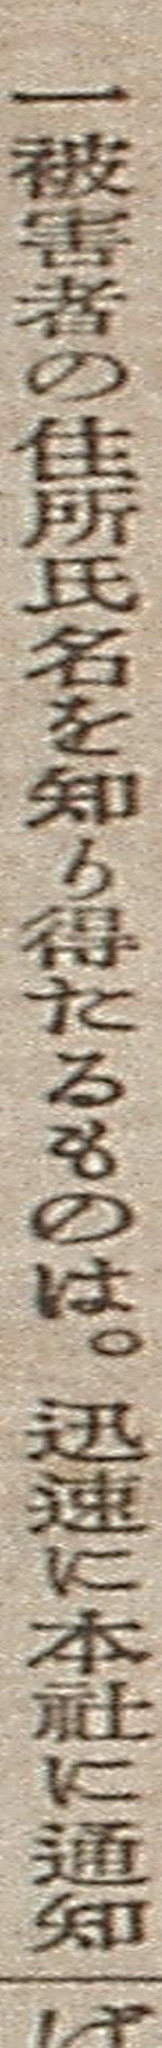一被害者の住所氏名を知り得たるものは。迅速に本社に通知
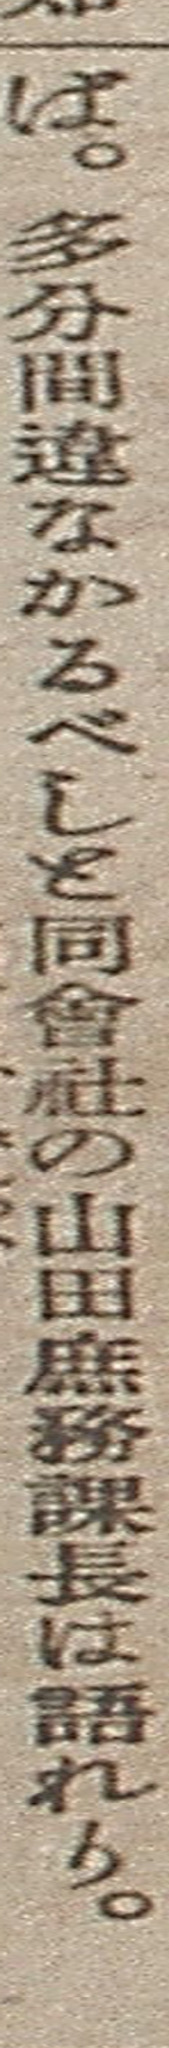ば。多分間違なかるべしと同会社の山田庶務課長は語れり。
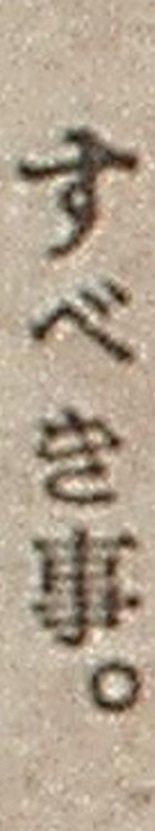すべき事。
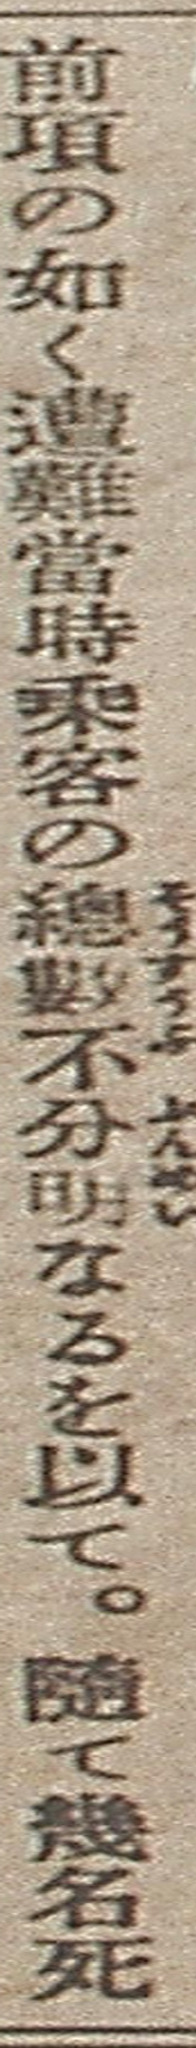前項の如く遭難当時乗客の総数不分明なるを以て。随て幾名死
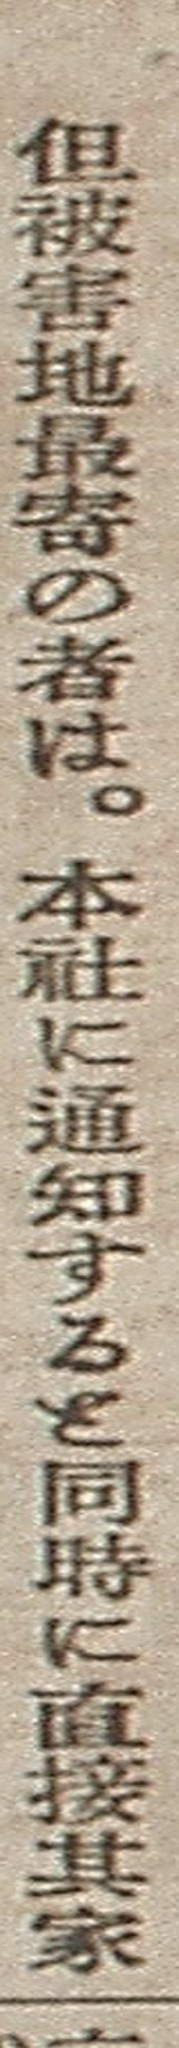但被害地最寄の者は。本社に通知すると同時に直接某家
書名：風俗畫報臨時増刊第百九十九號　明治三十二年十月各地災害圖會（前編之續）
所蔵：東京大学地震研究所図書室 Earthquake Research Institute Library, The University of Tokyo, JAPAN
